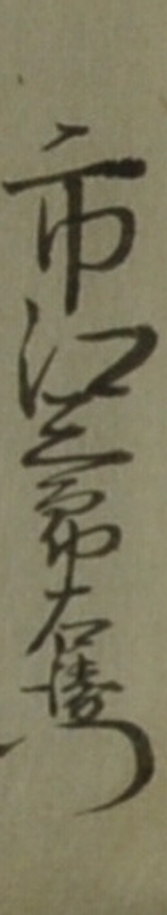市江三郎右衛門
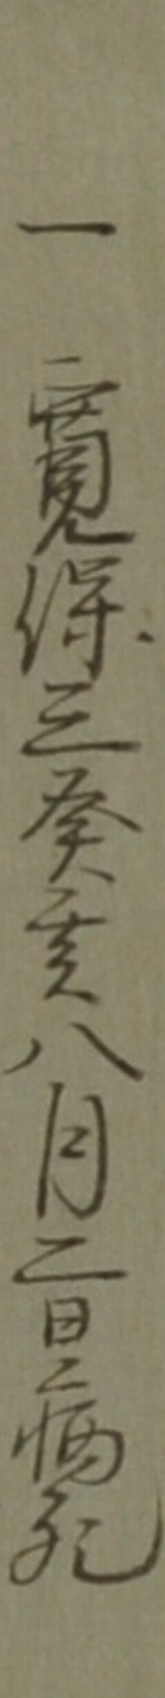一寛保三癸亥八月二日病死
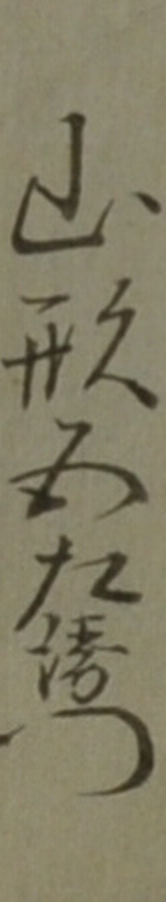山形五左衛門
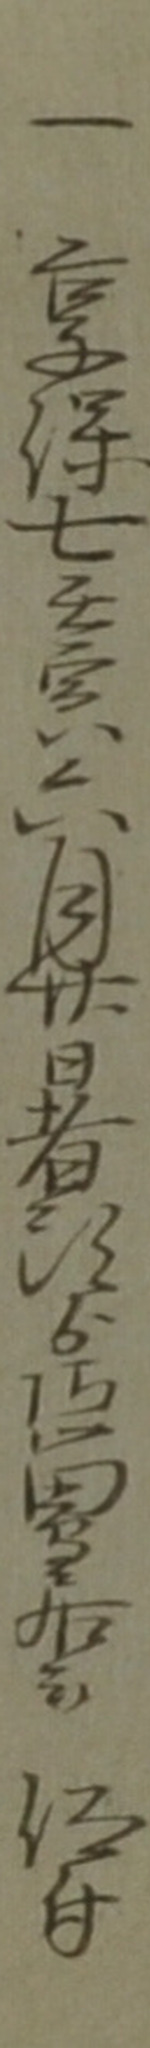一享保七壬寅六月廿日者頭ゟ御留守被仰付
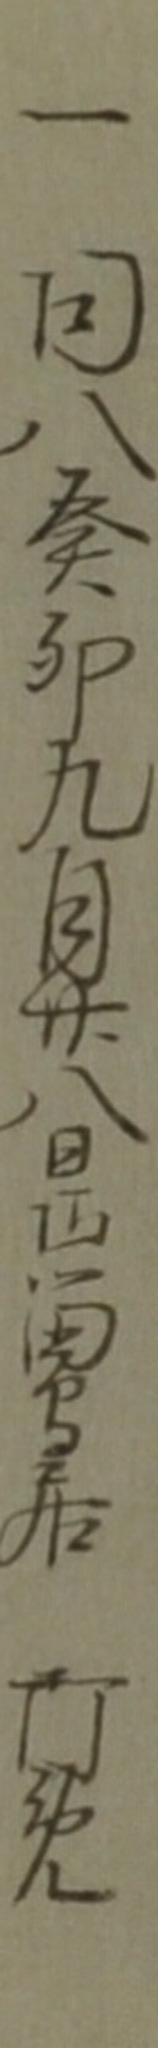一同八癸卯九月廿八日御留守居御免
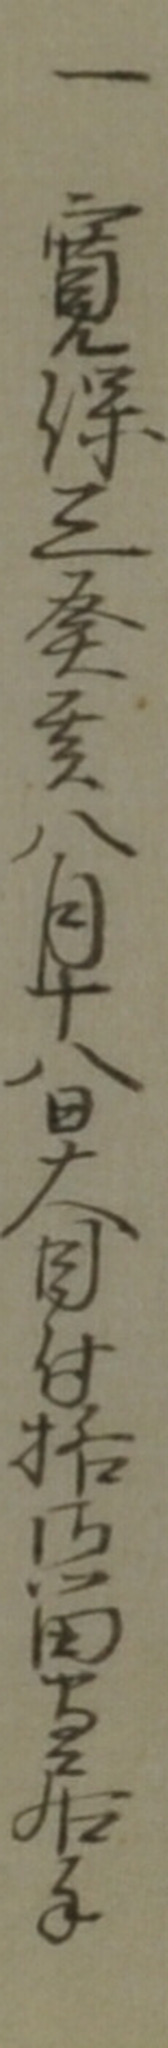一寛保三癸亥八月十八日大目付格御留守居手
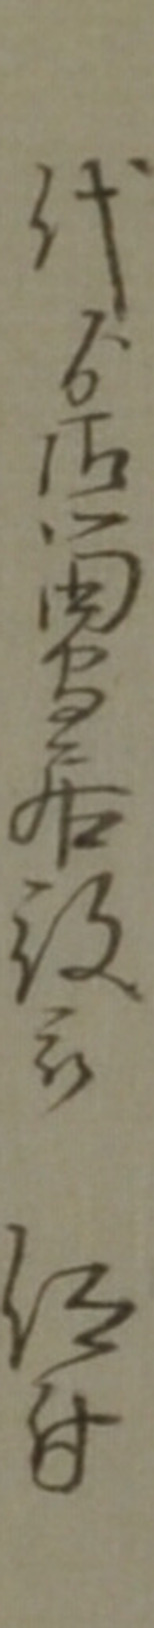代ゟ御留守居役被仰付
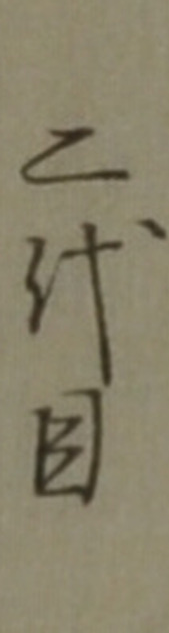二代目
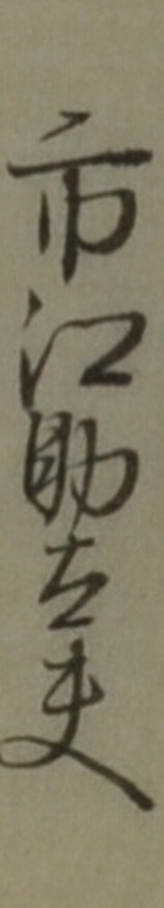市江助太夫
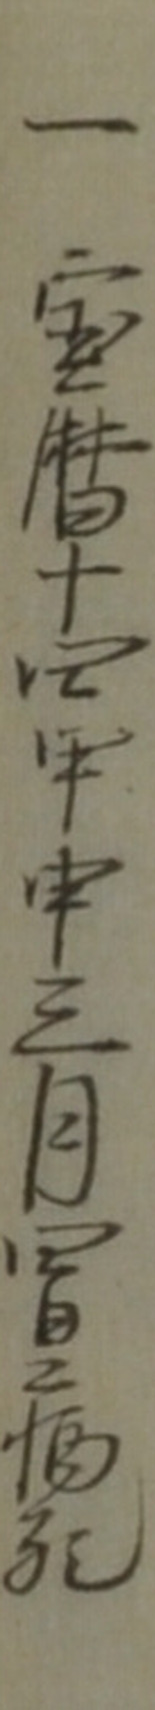一宝暦十四甲申三月四日病死
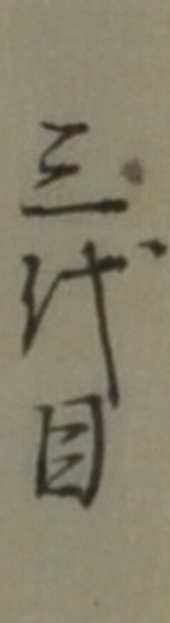三代目
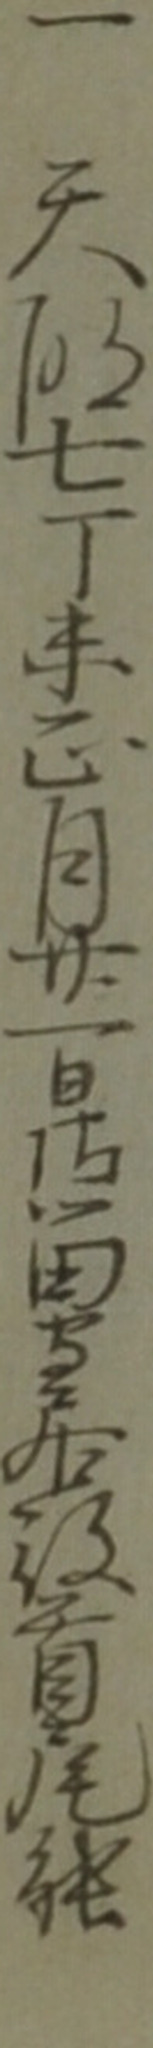一天明七丁未正月廿一日御留守居役首尾能
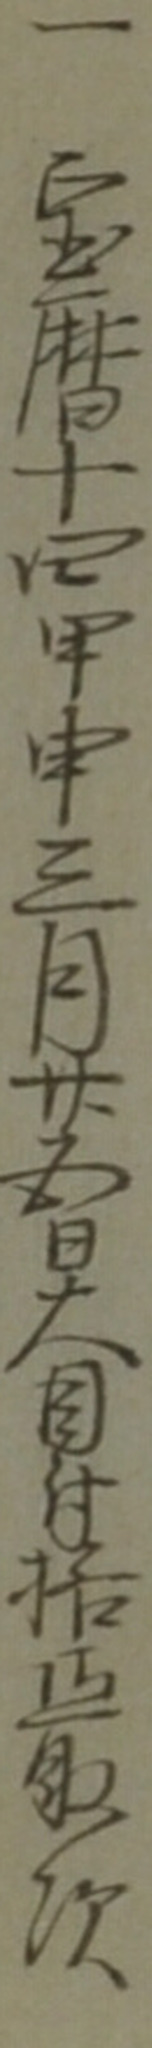一宝暦十四甲申三月廿五日大目付格御取次
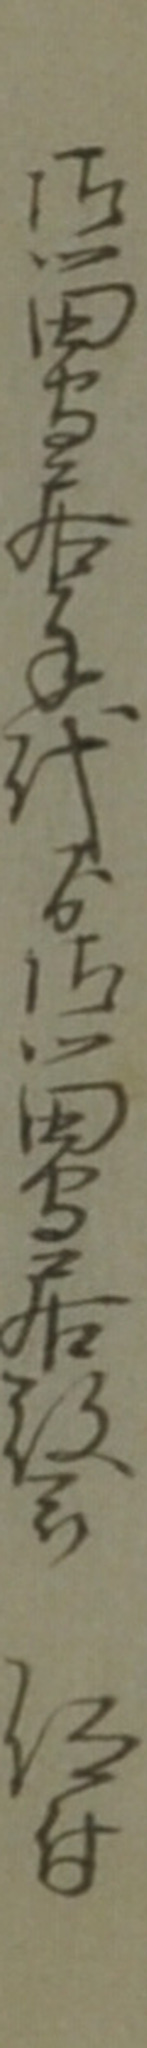御留守居手代ゟ御留守居役被仰付
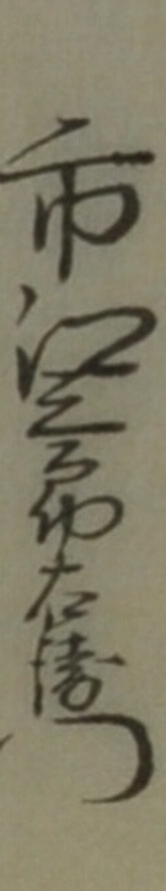市江三郎右衛門
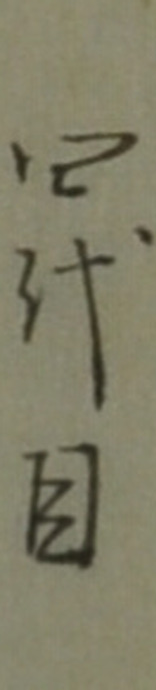四代目
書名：諸御役代々録（三）
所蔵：伊那市立高遠町図書館・合同会社AMANE
